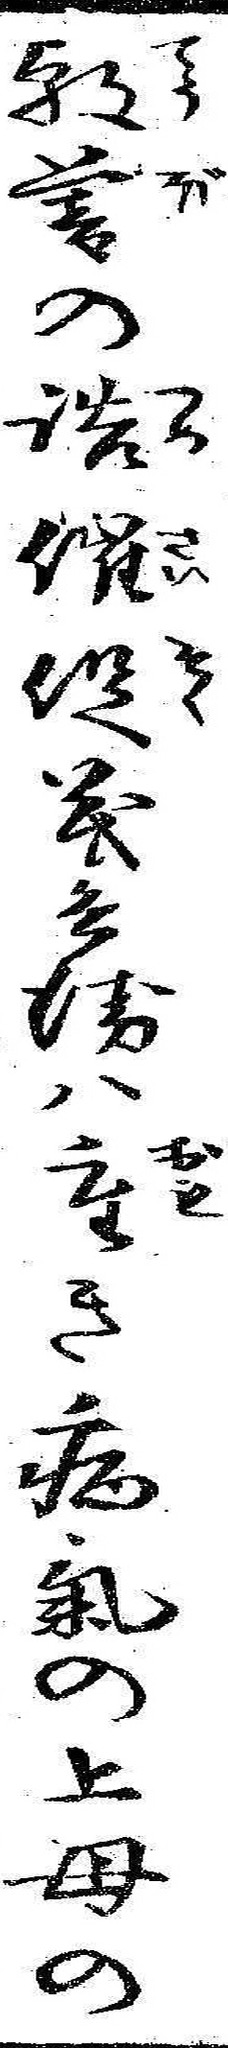朝暮の詰催促義兵衛は重き病気の上母の
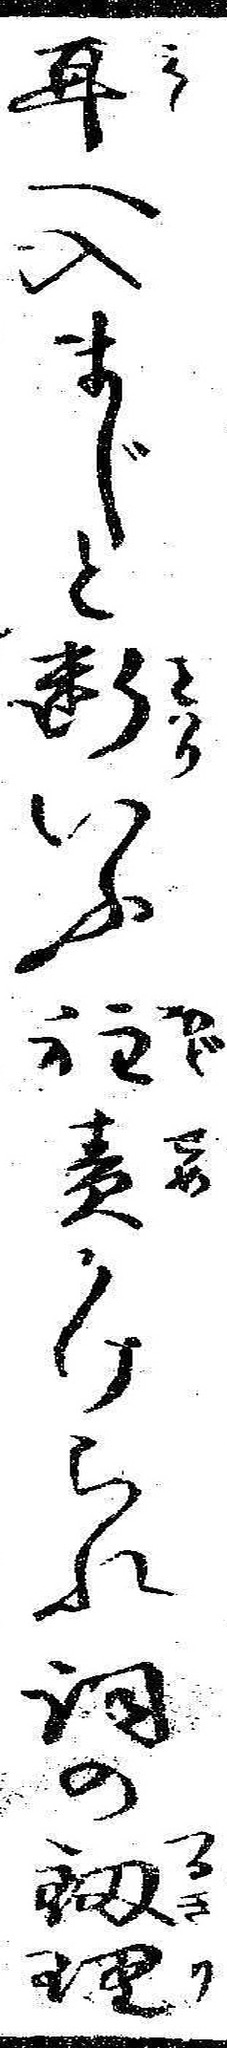耳へ入まじと断いふ程責かけられ詞の剣理
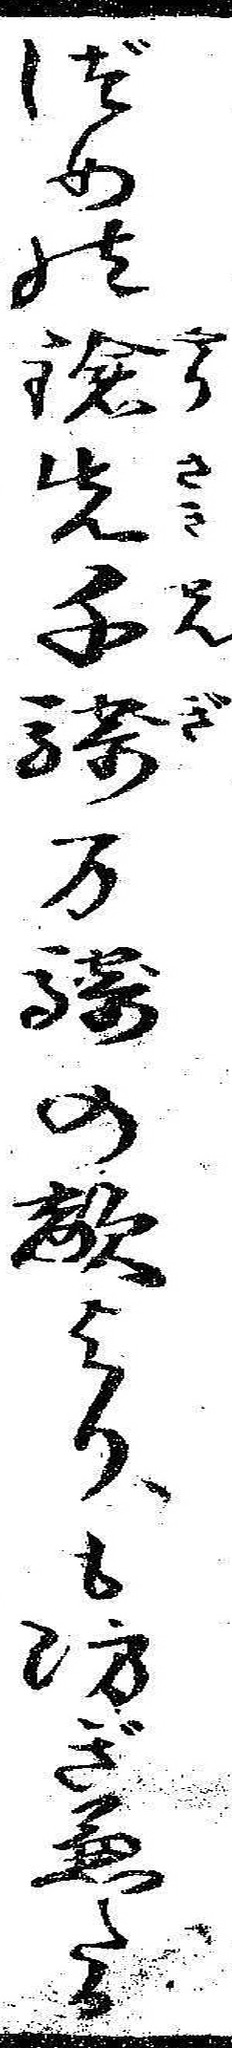づめの槍先千騎万騎の敵よりも防ぎ兼たる
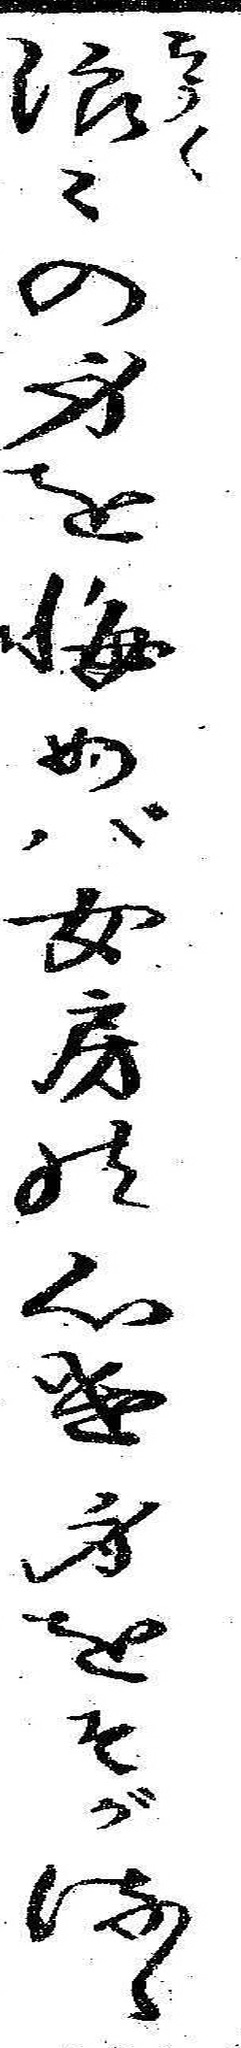浪々の身を悔めば女房の心遣身をそがるゝ

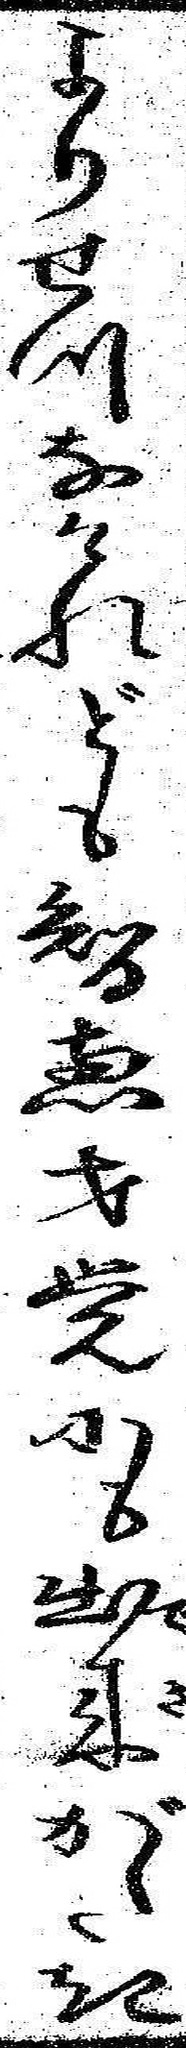よりせつなけれども智恵才覚にも出来がたき
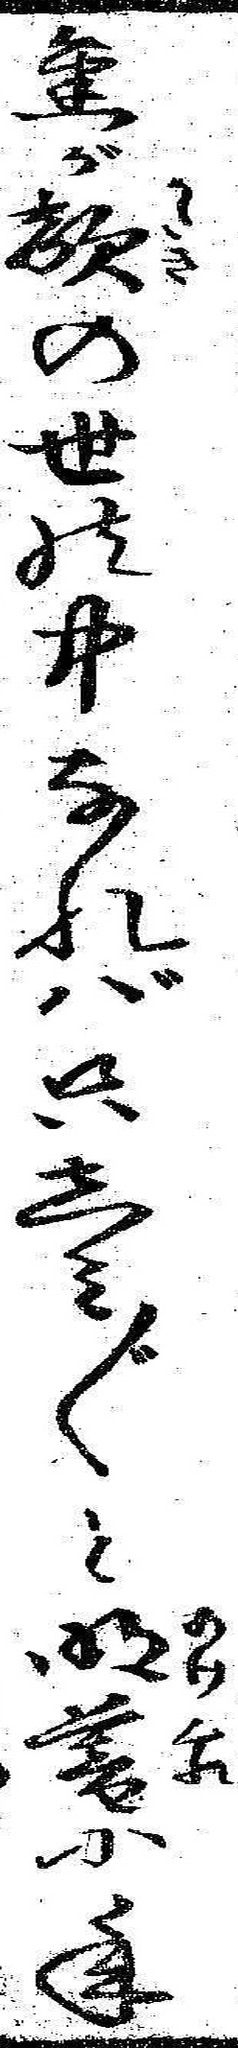金が敵の世の中なれば只しみ〲と明暮に年
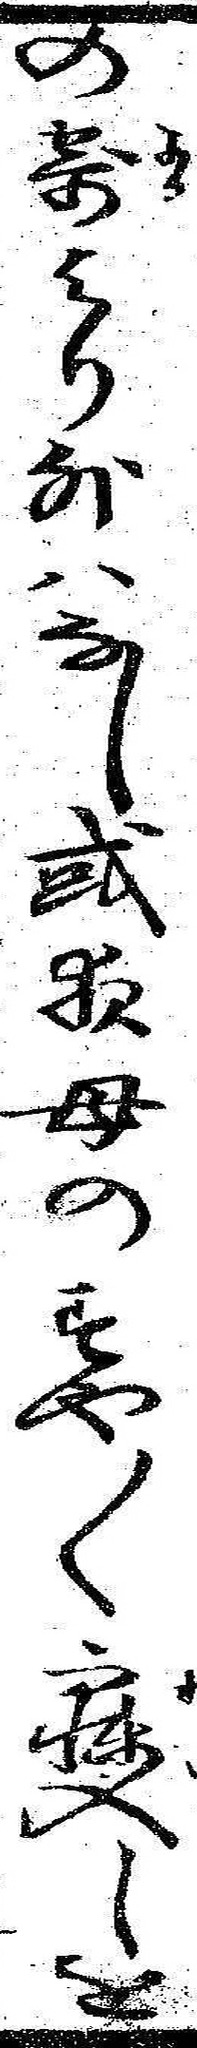の寄より外はなし或夜母のすや〱寐入しを
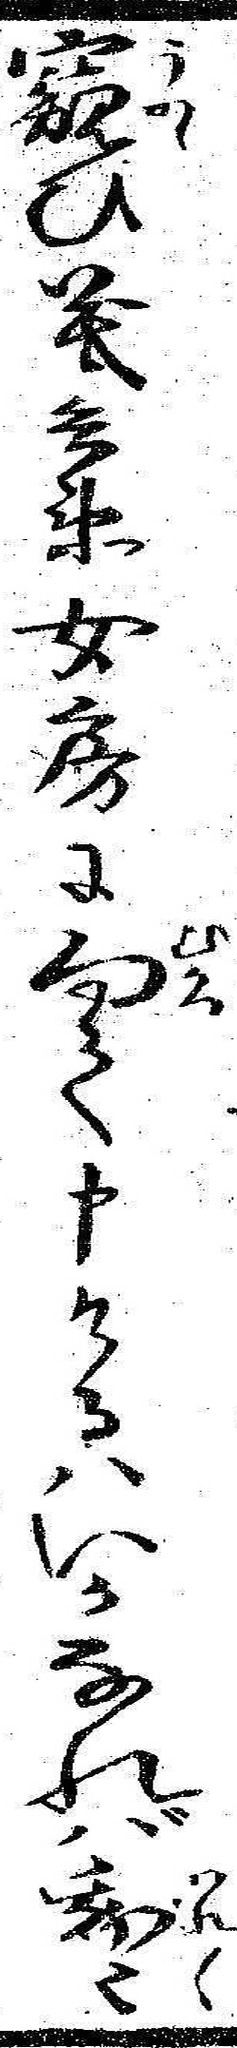窺ひ義兵衛女房に向て申けるはいかなれば我々
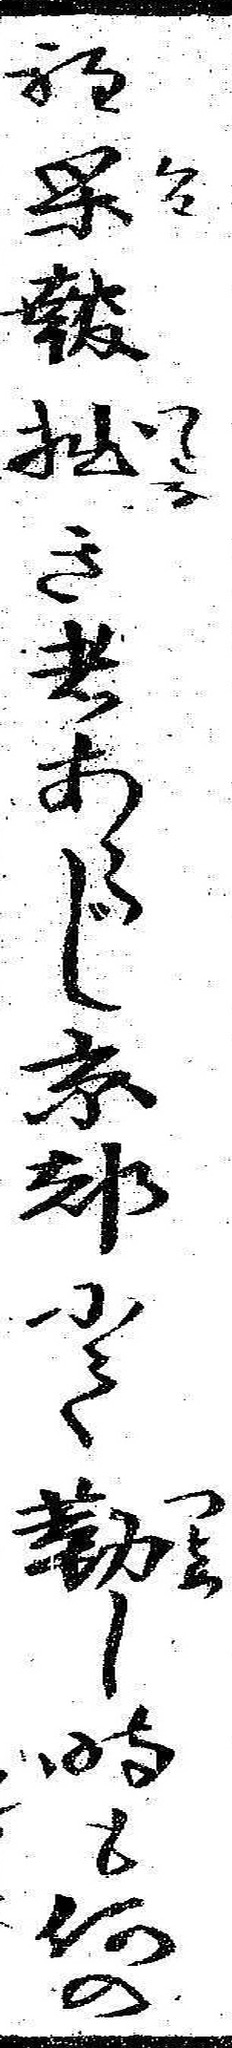程果報拙き者あらじ京都にて勤し時も何の
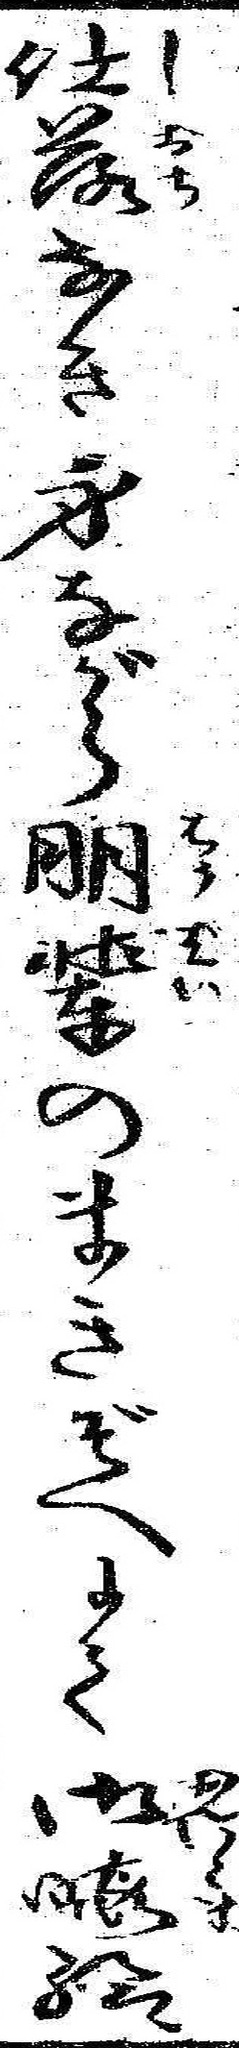仕落なき身ながら朋輩のまきぞへにて御晦給
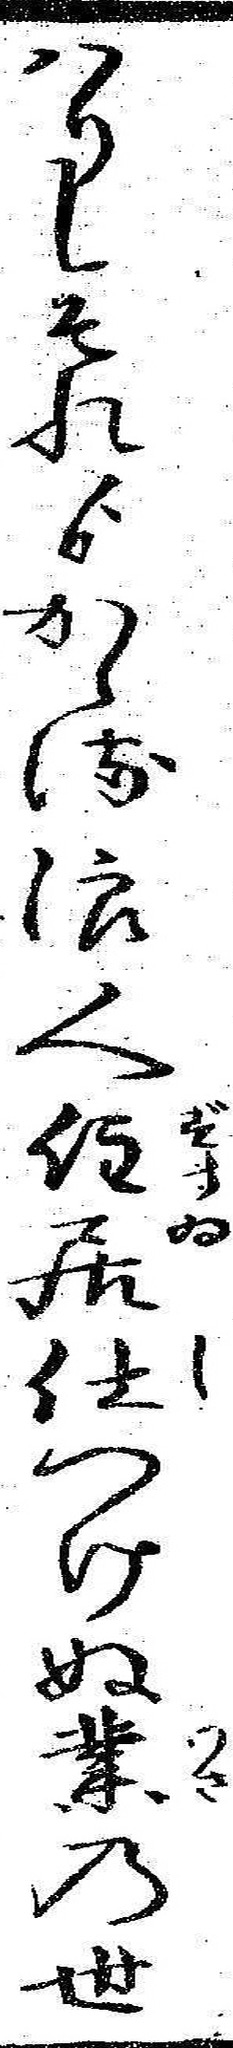はりしそれゟかゝる浪人住居仕つけぬ業の世
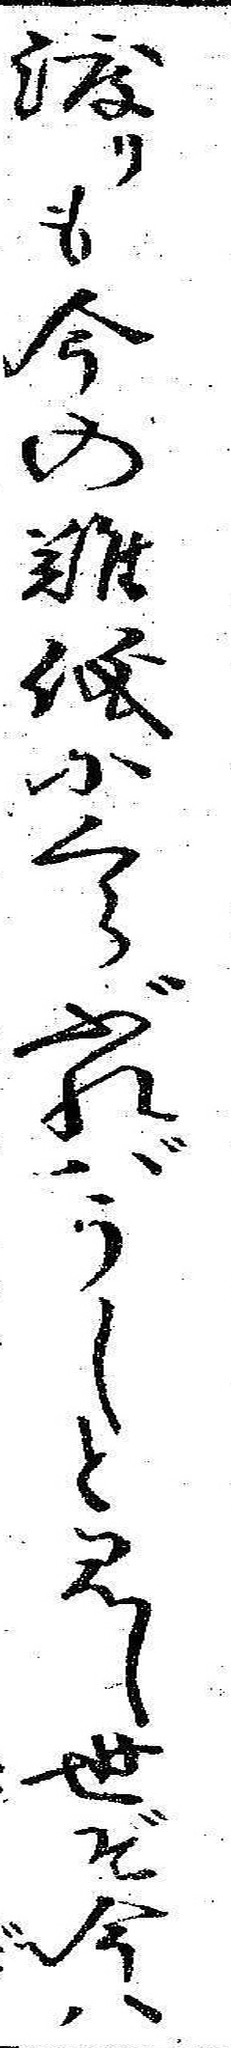渡りも今の難儀にくらぶればうしと見し世ぞ今は
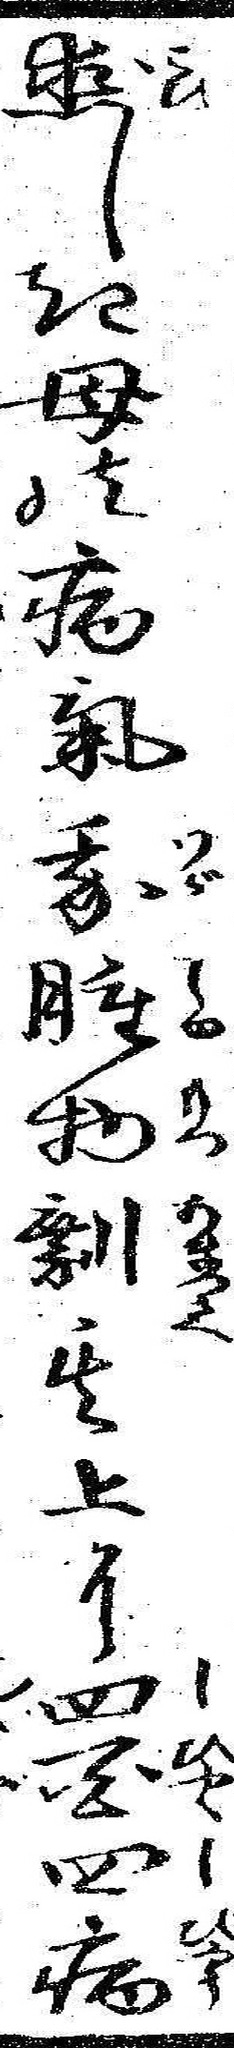恋しき母の病気我腫物剰其上に四百四病
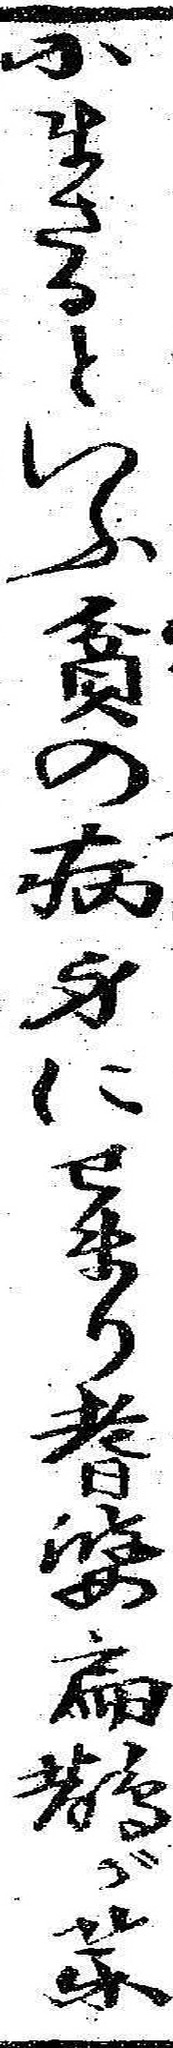にまさるといふ貧の病身にせまり耆婆扁鵲が薬
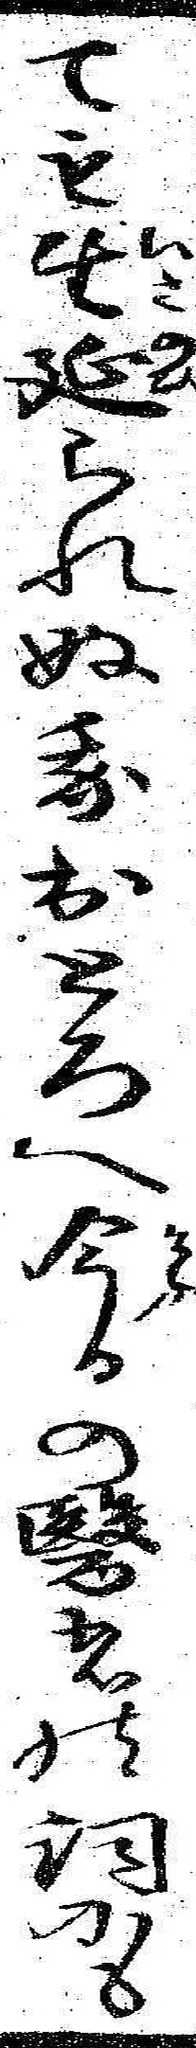ても生延られぬ我おとろへ今日の医者の詞にも
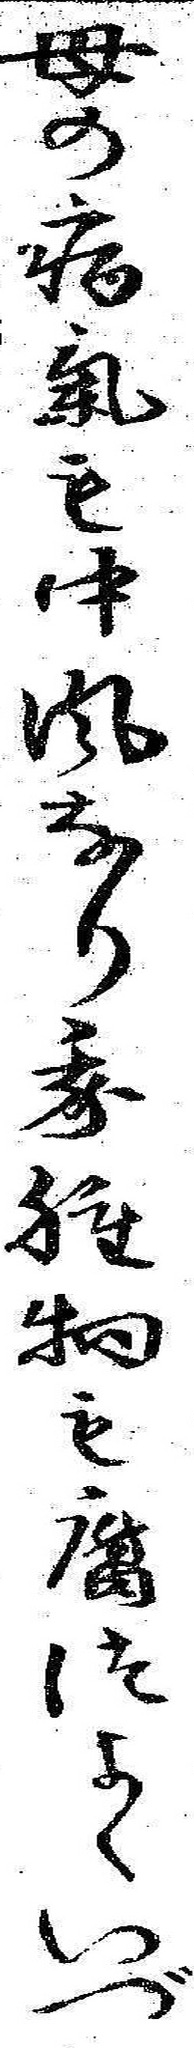母の病気も中風なり我種物も腐つよくいづ
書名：根無草後編
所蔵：国文学研究資料館
